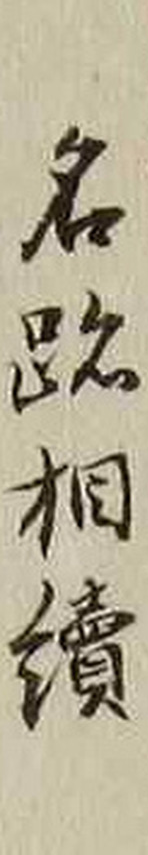名跡相続
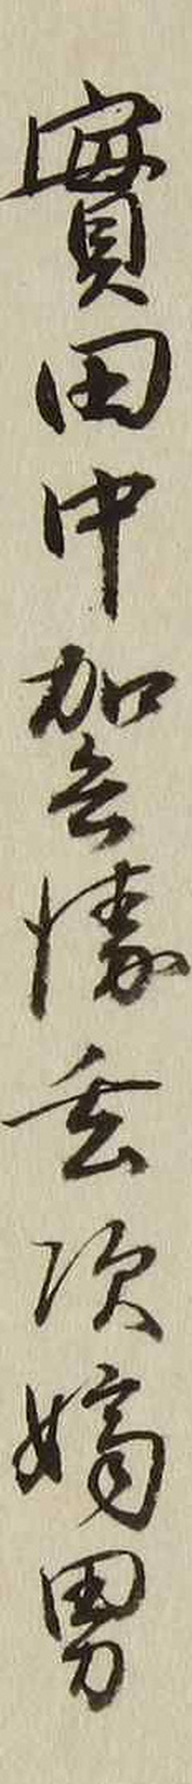実田中加兵幡玄次嫡男
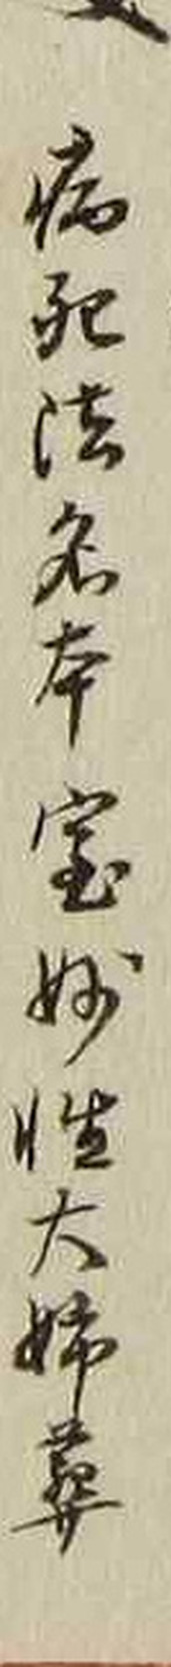病死法名本室妙性大姉葬
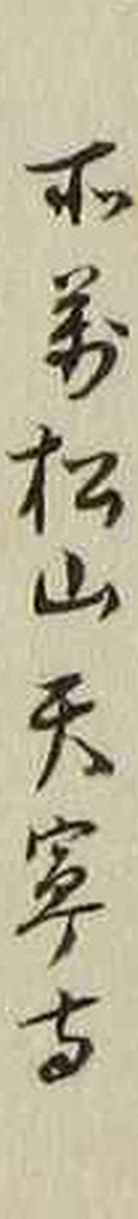所万松山天寧寺
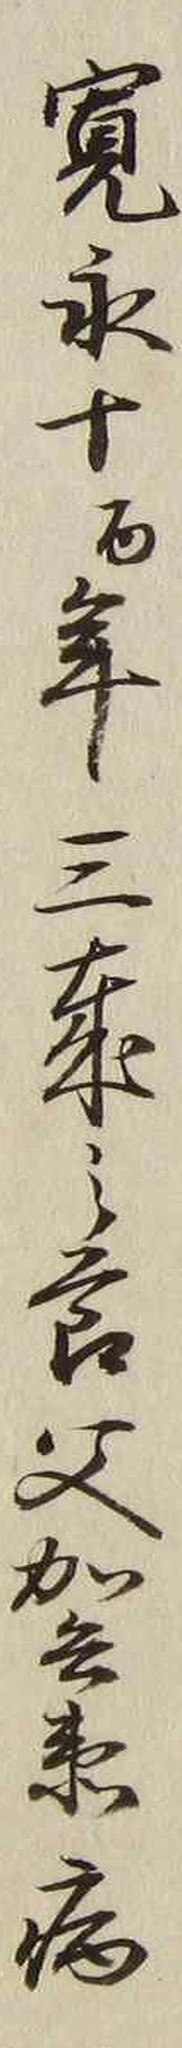寛永十酉年三歳之節父加兵衛病
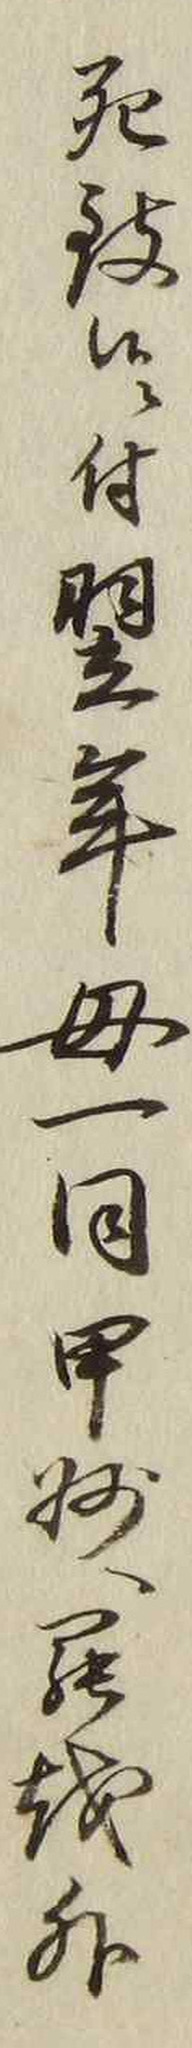死致候に付翌年母一同甲州へ罷越外
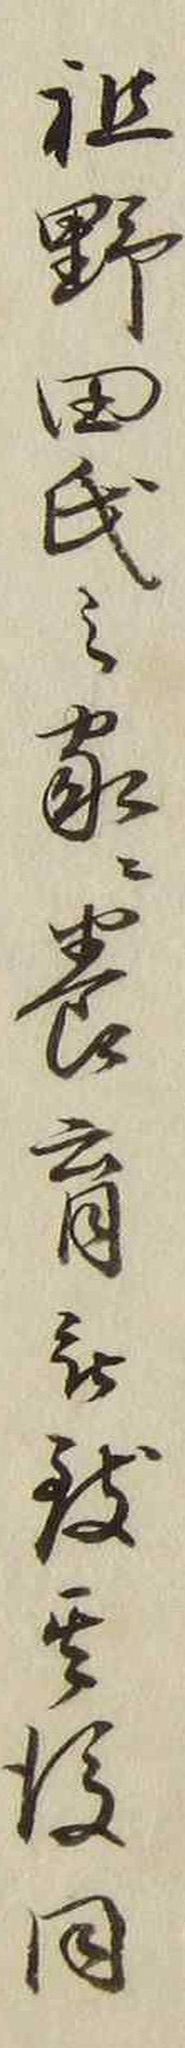祖野田氏之家に養育被致其後同

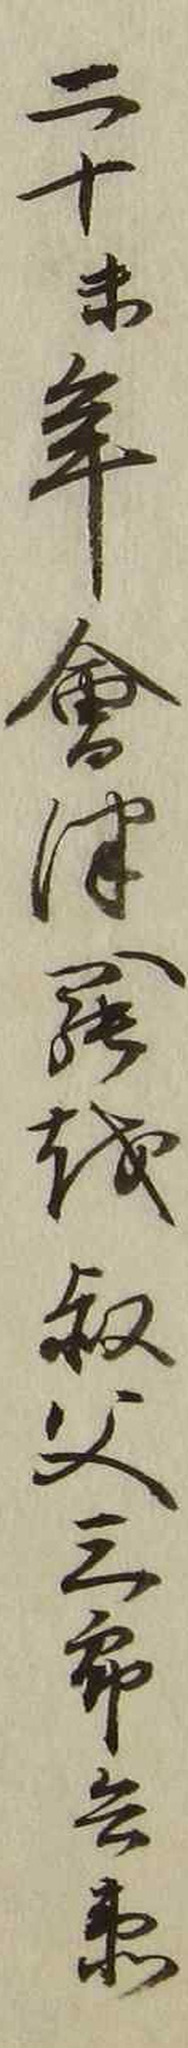二十未年会津へ罷越叔父三郎兵衛
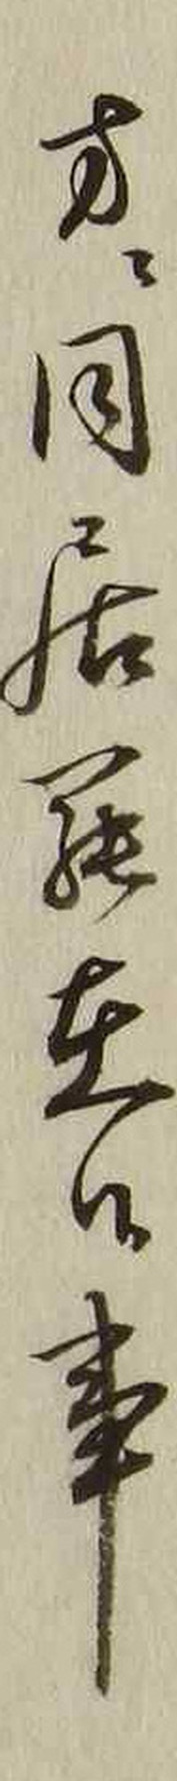方に同居罷在候事
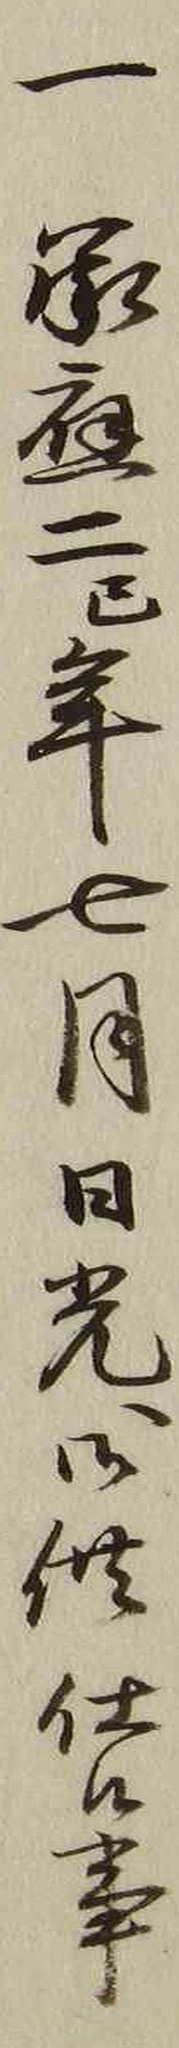一承応二巳年七月日光へ御供仕候事
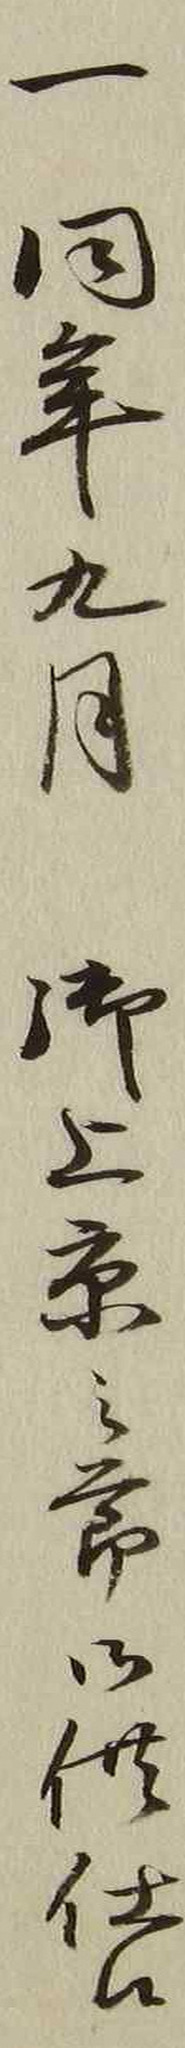一同年九月御上京之節御供仕候
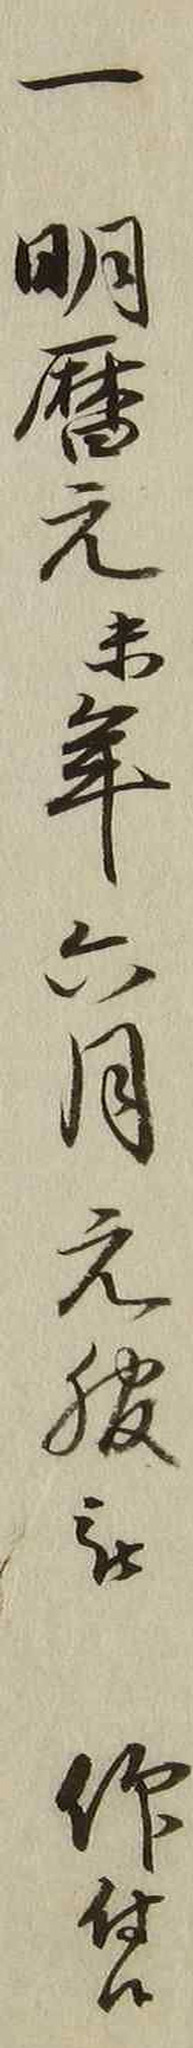一明暦元未年六月元服被仰付候
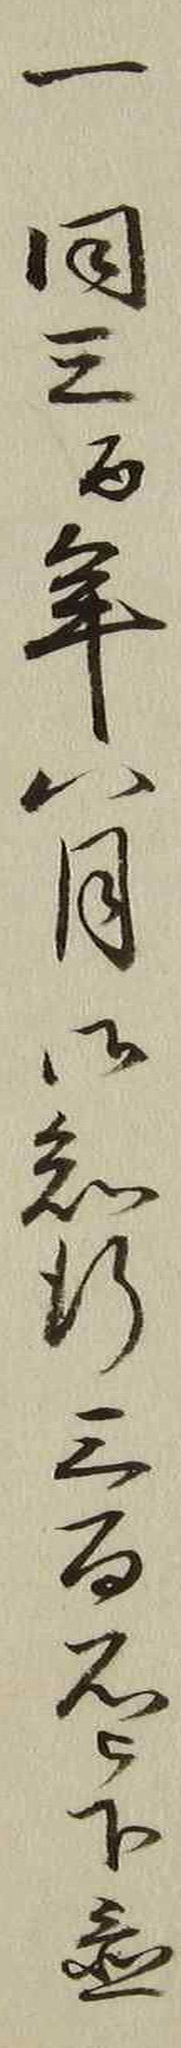一同三酉年八月御知行三百石被下置
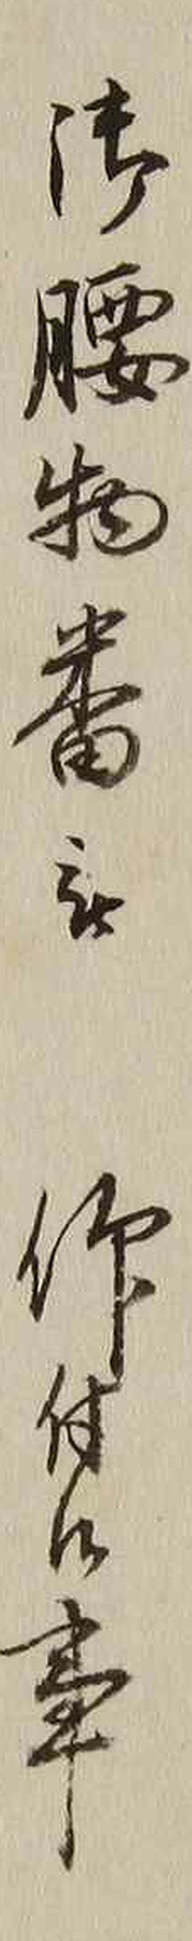御腰物番被仰付候事
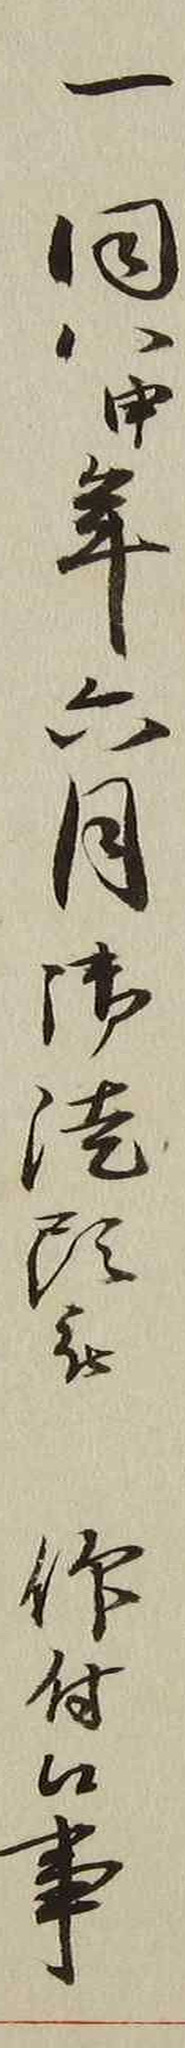一同八申年六月御徒頭被仰付候事
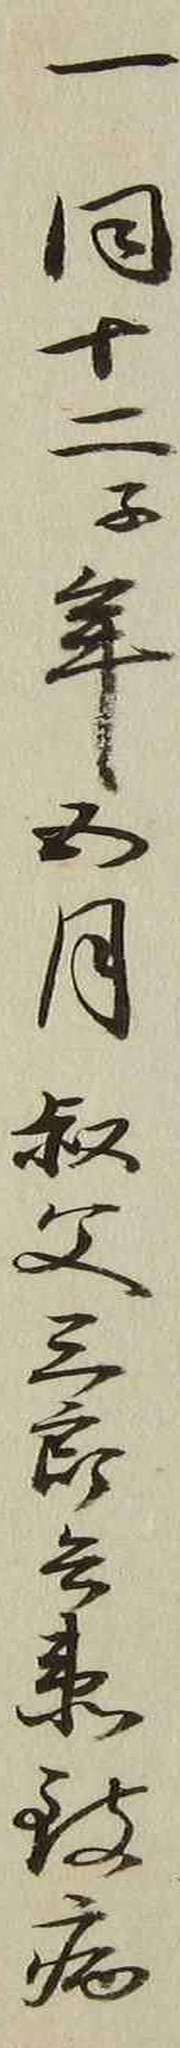一同十二子年五月叔父三郎兵衛致病
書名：諸士系譜　巻之125　た之部1
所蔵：会津若松市立会津図書館
